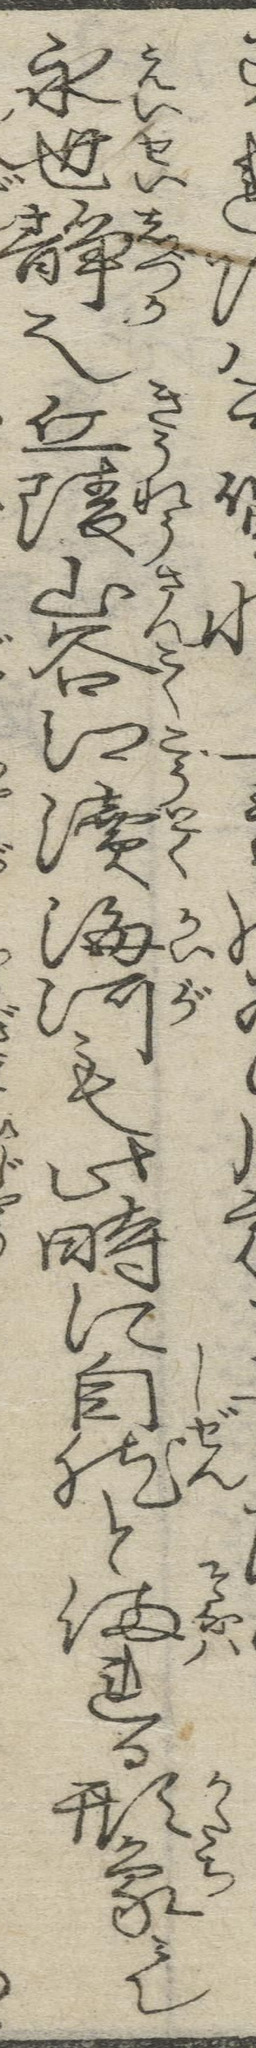永世静也丘陵山谷江瀆海河も此時に自然と備れる形象は
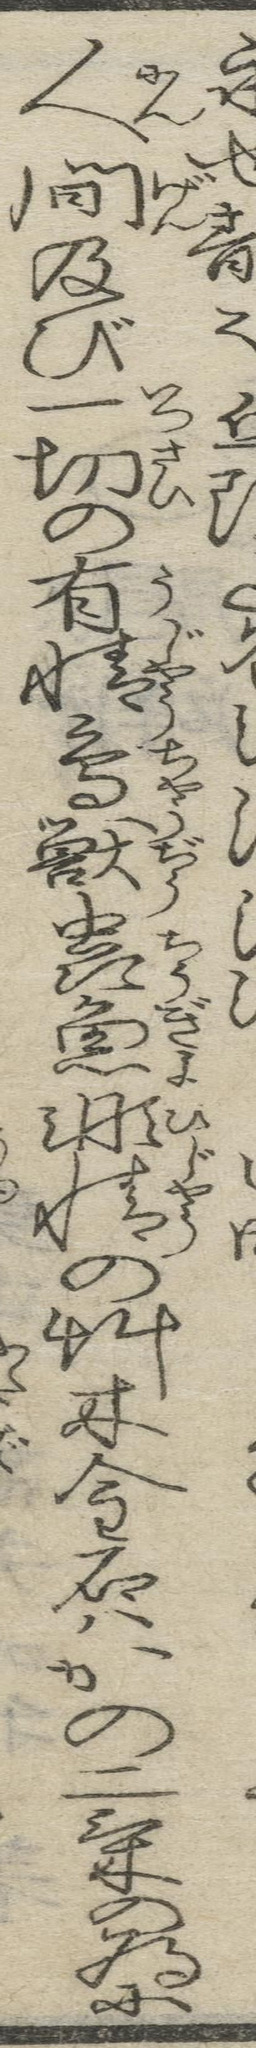人間及び一切の有情鳥獣蟲魚非情の竹木金石はかの二氣の為に
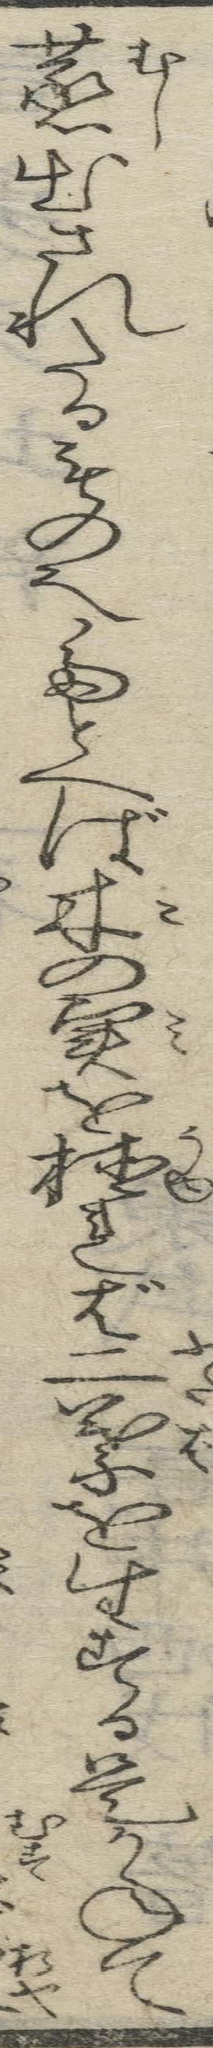蒸出されたるもの也たとへば木の実を植れば二葉を生する是かねて
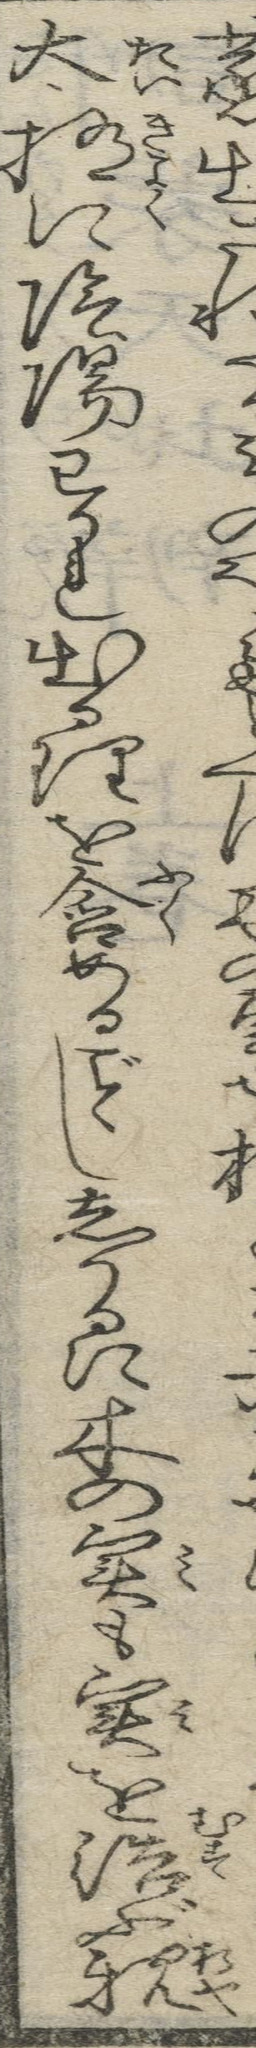太極に陰陽わかれ出る理を含めるごとししかるに木の実も実を結ぶ親
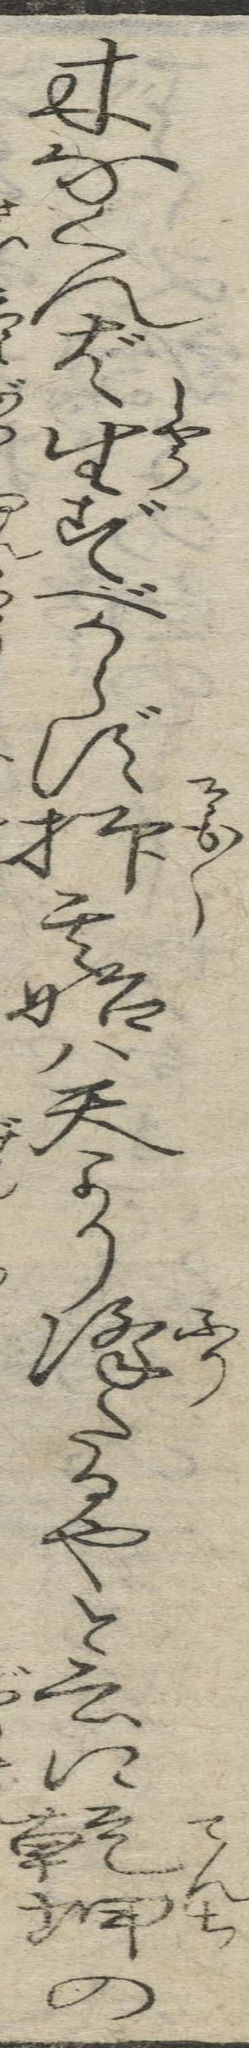木なくんば生ずべからず抑其始は天より降たるやと云に乾坤の
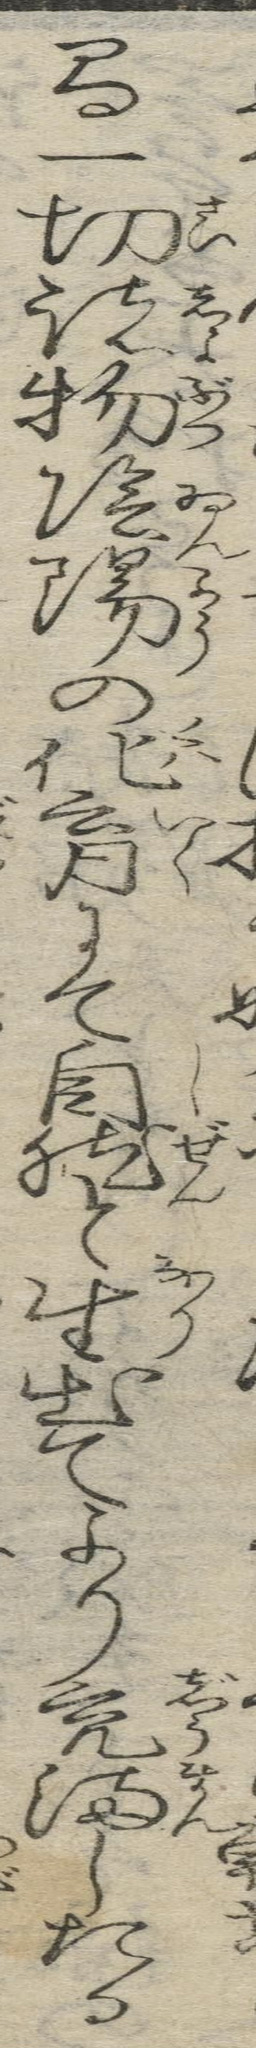間一切諸物陰陽の化育にて自然と生出てより充満したる
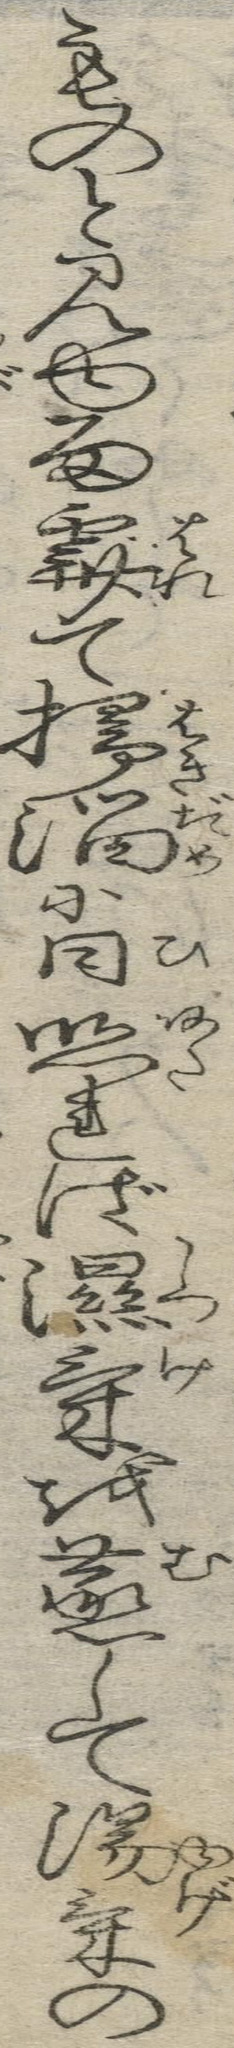ものと見ゆる霽て掃溜に日照れば湿氣を蒸して湯氣の
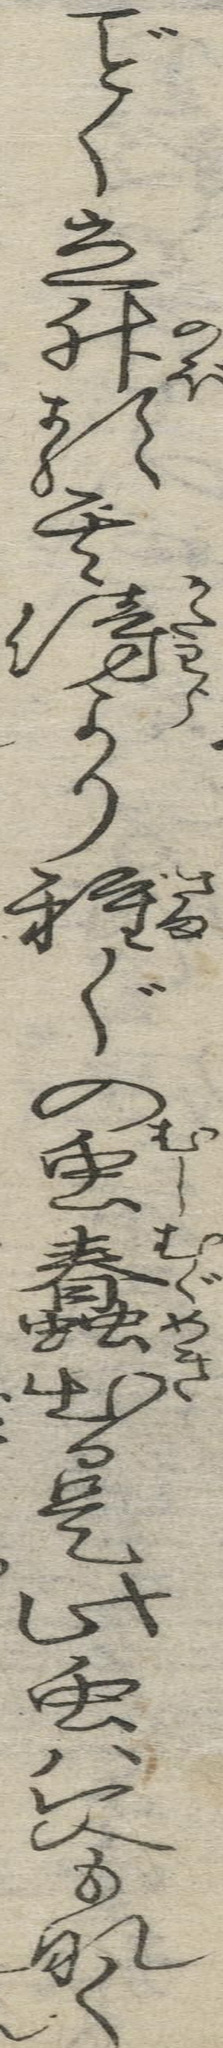ごとく立升る其傍より種〴〵の虫蠢出る是此虫は父もなく
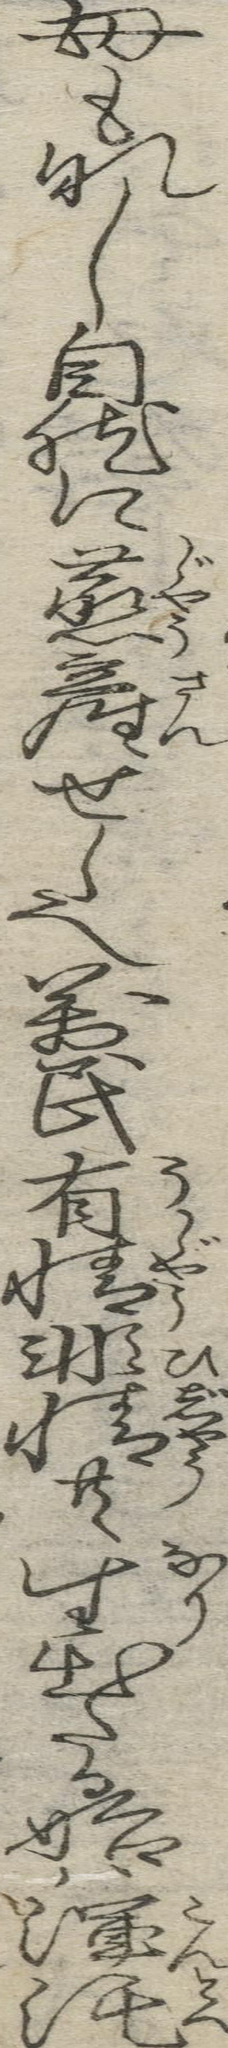母もなし自然に蒸産せし也萬民有情非情其生出たる始は渾沌
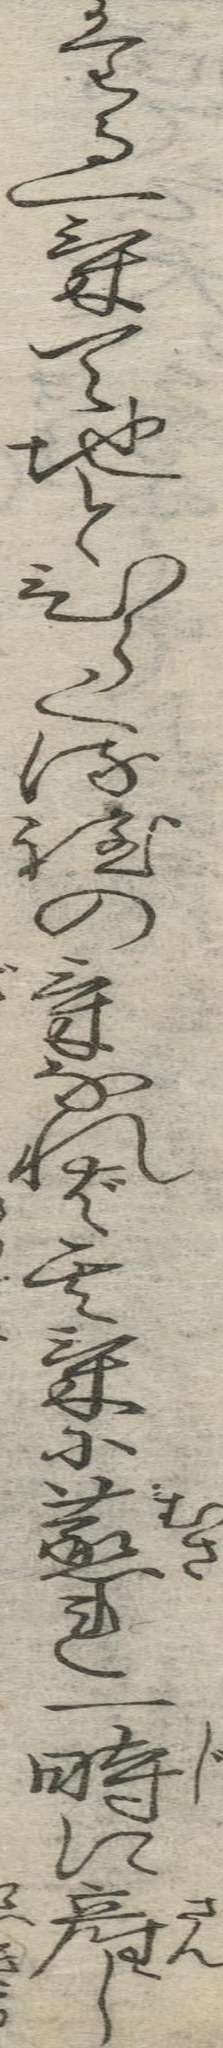たる一氣天地とひらくる程の氣なれば其氣に蒸れ一時に産し
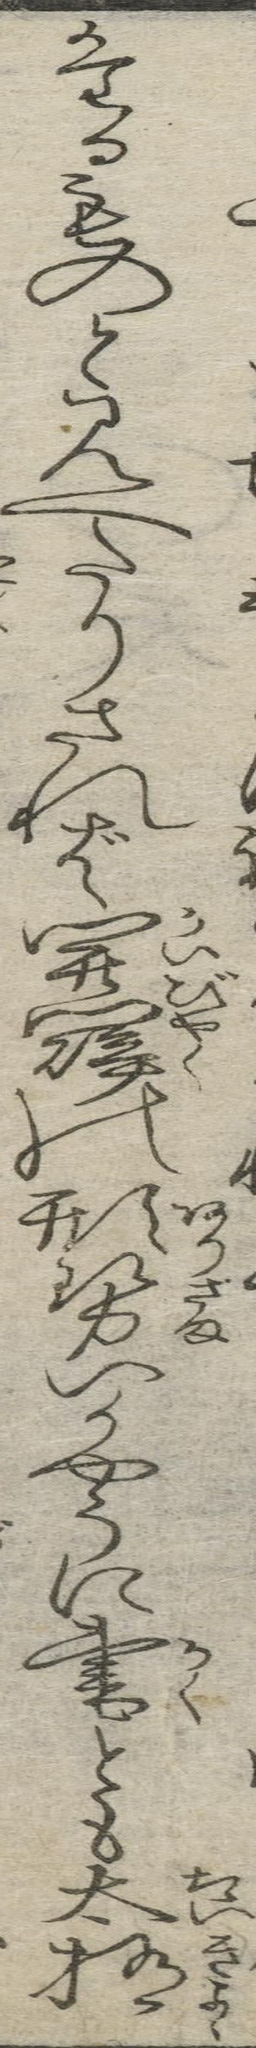たるものと見へたりされば開闢の形勢いかやうに書とも太極
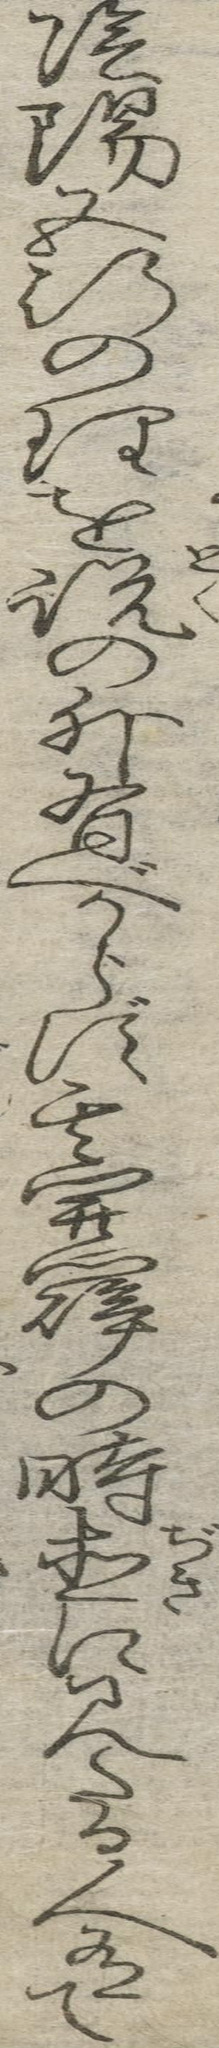陰陽五行の理を説の外有べからず其開闢の時直に見たる人有て
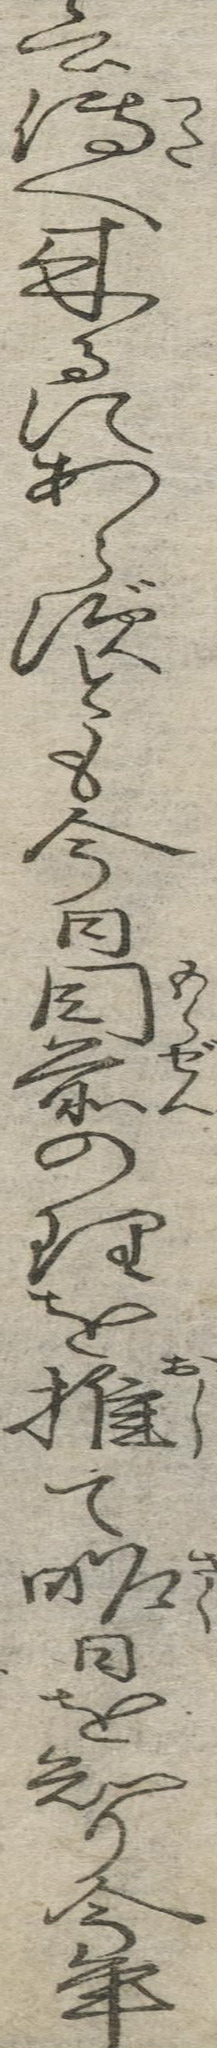云傳へ来るにあらずとも今日目前の理を推て昨日を知り今年
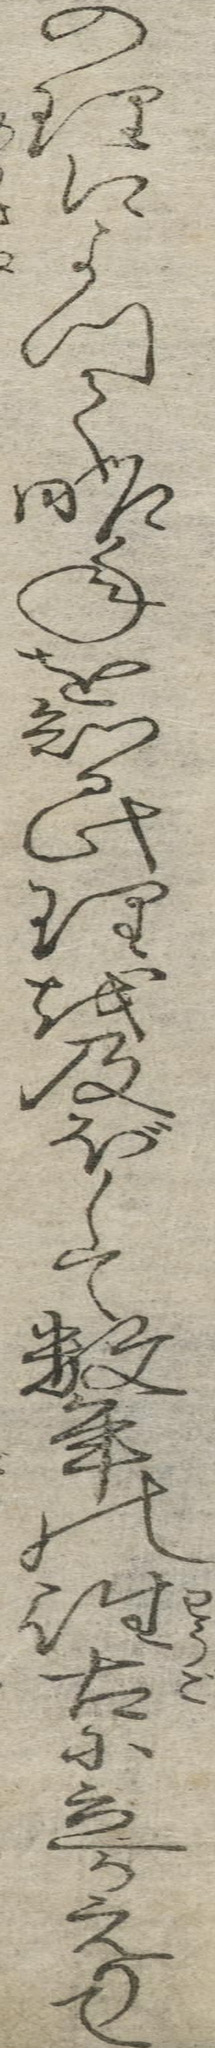の理によつて昨年を知るの理を及ぼして数年の往古に立かえりて
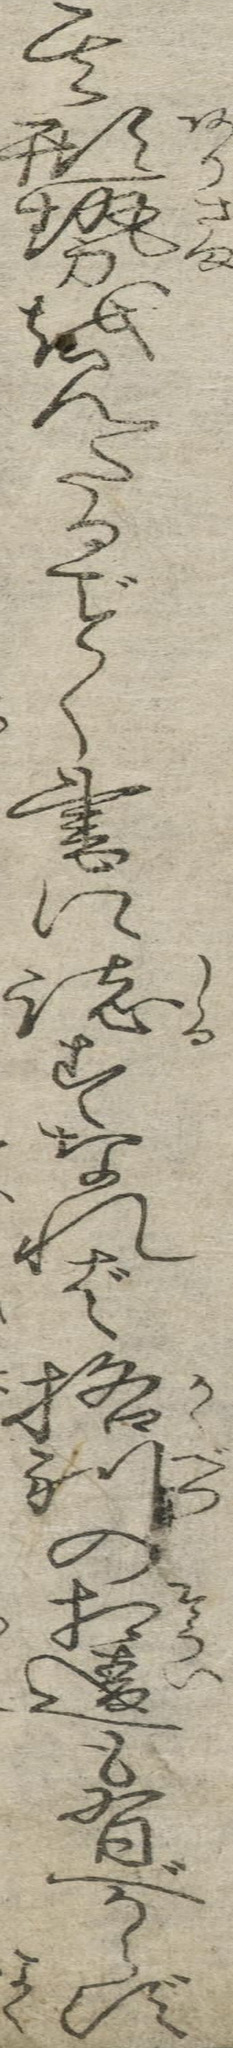其形勢を見たるごとく書に誌すなれば格別の相違も有べからず
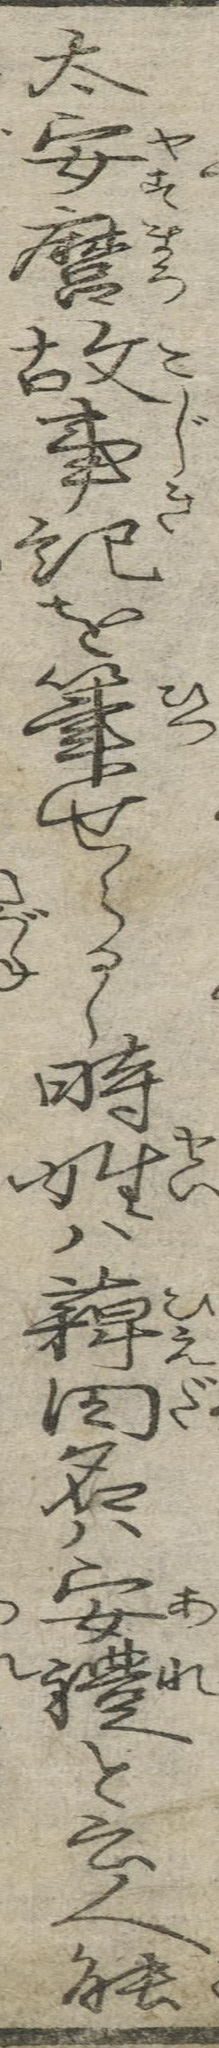太安麿故事記を筆せらるゝ時姓は薭田名は安礼と云人能
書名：訓蒙天地辨　天
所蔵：東京大学地震研究所図書室 Earthquake Research Institute Library, The University of Tokyo, JAPAN
